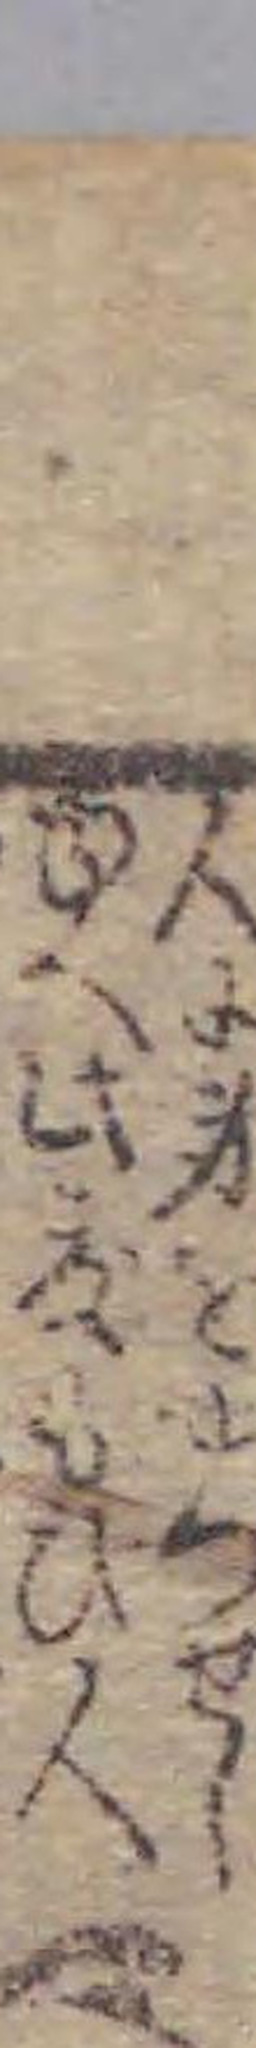ゆへ此度もひ人
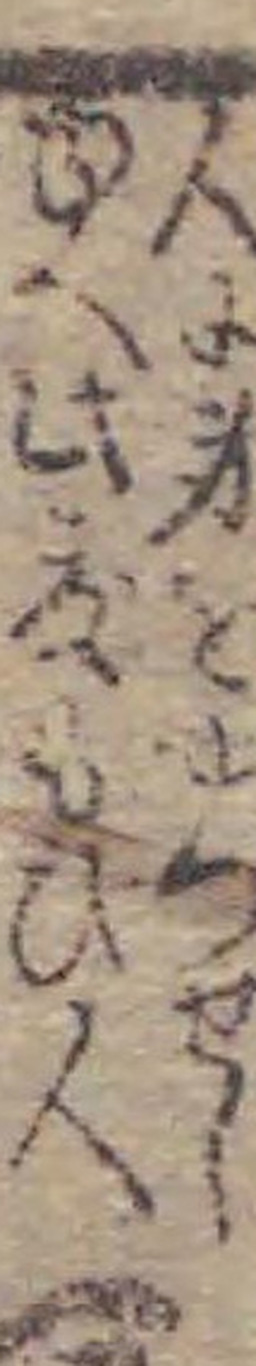ゆへ此度もひ人
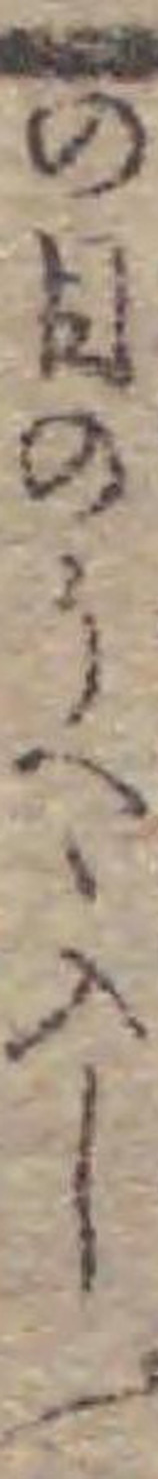の目のうへゝ入し
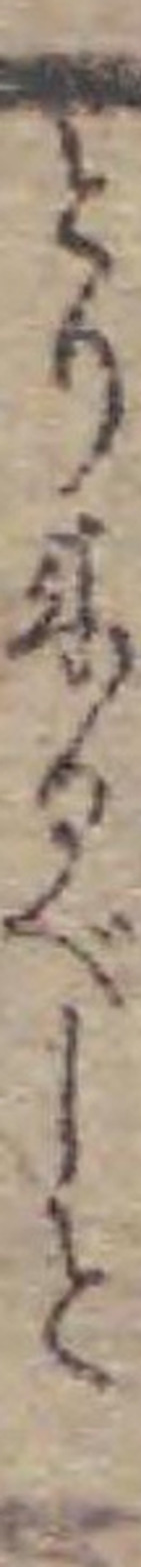とり来るべしと
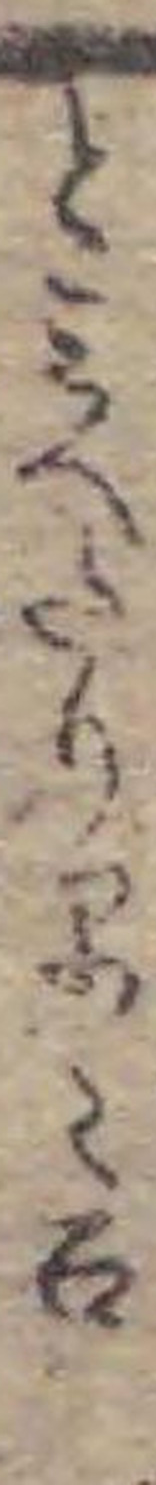とみへたり早々召
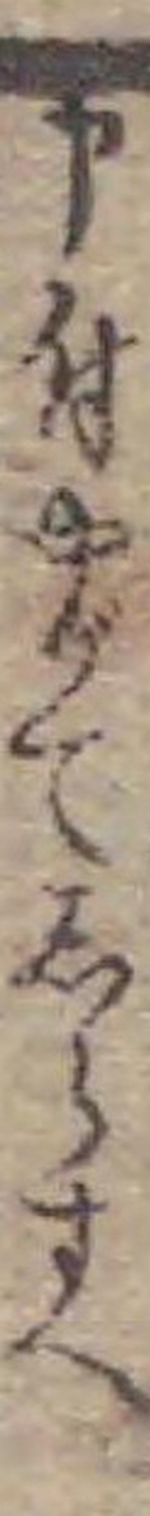申付やがてしらすへ
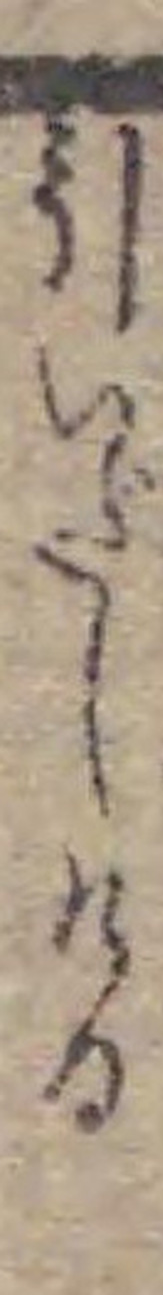引いだしける
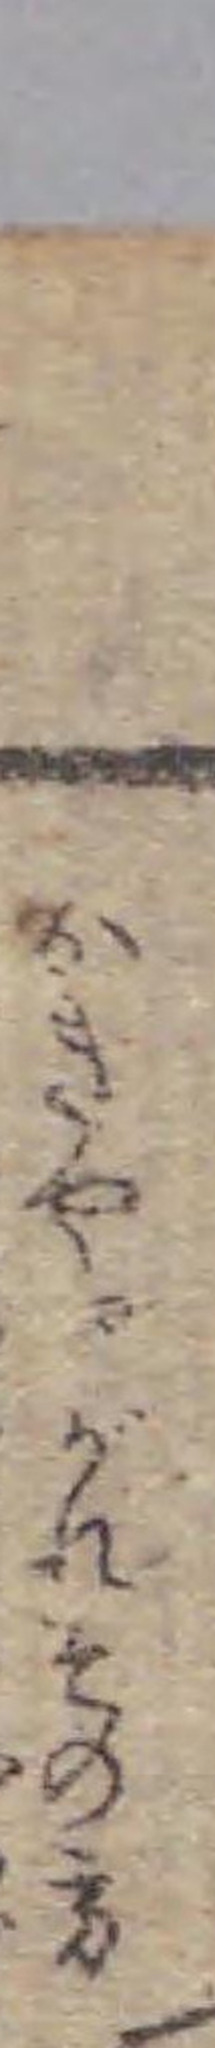おきやァがれその方
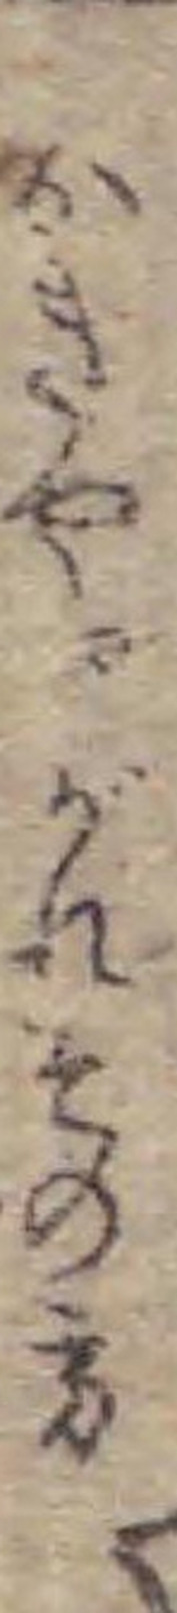おきやァがれその方
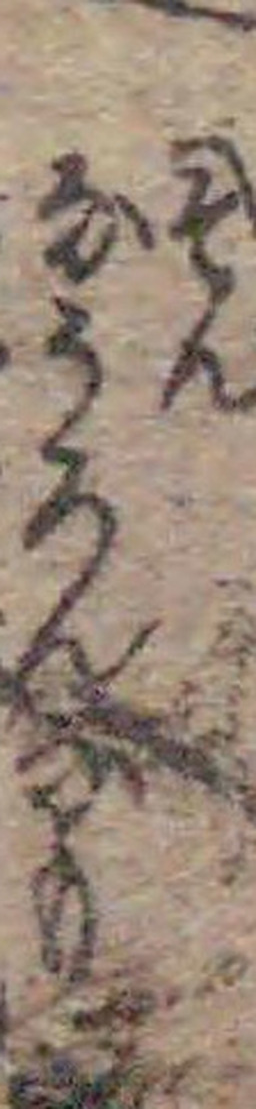なうろんなもの
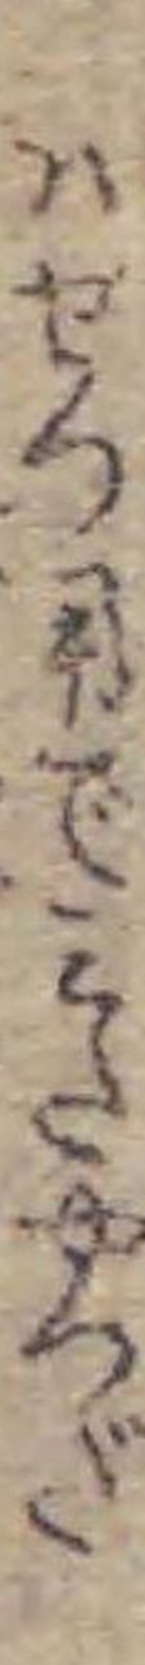はせつ用でみたやつだ
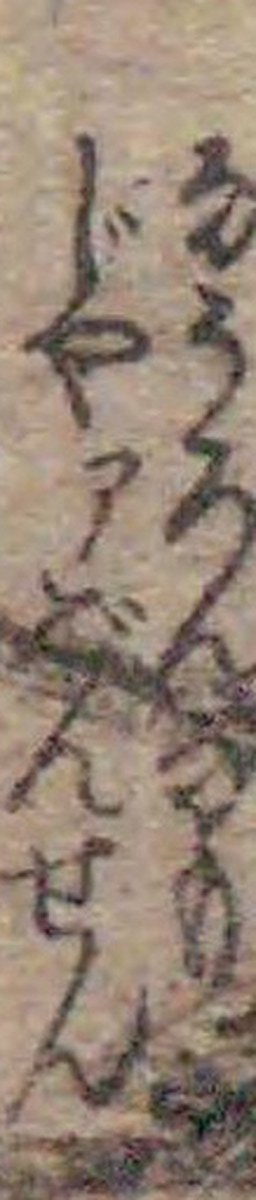じやァごんせん
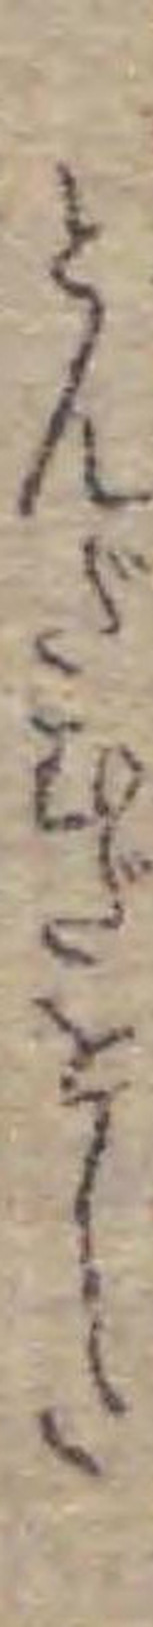とんだむだをした
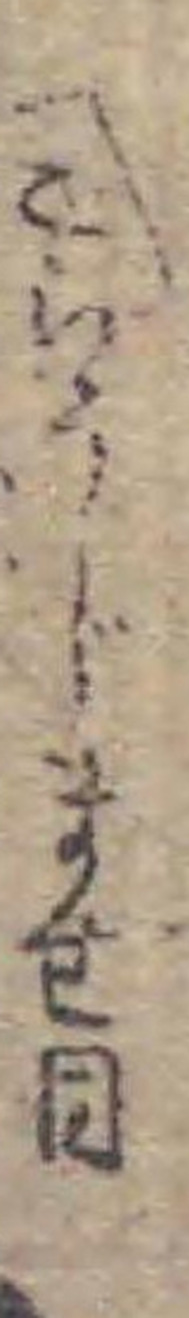〽ごらうじませ目
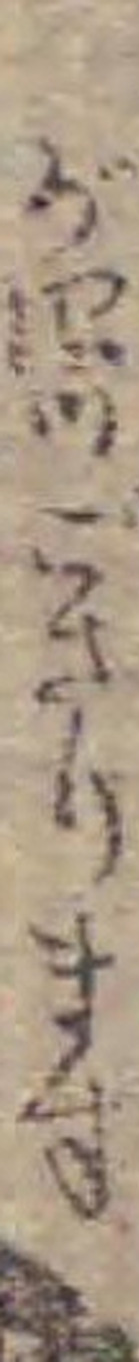が四つござります
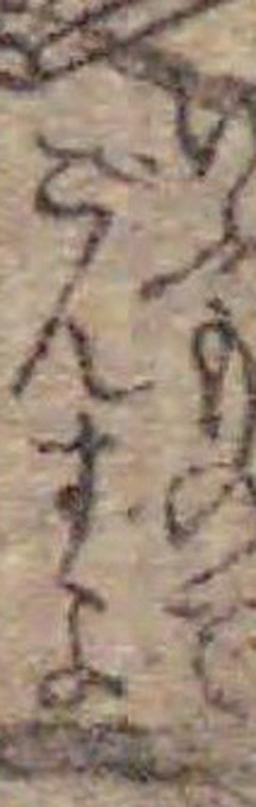ごんすよ
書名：悪七変目景清 : 2巻
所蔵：国立国会図書館 National Diet Library, JAPAN
